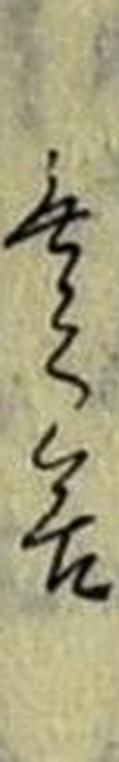無之筈
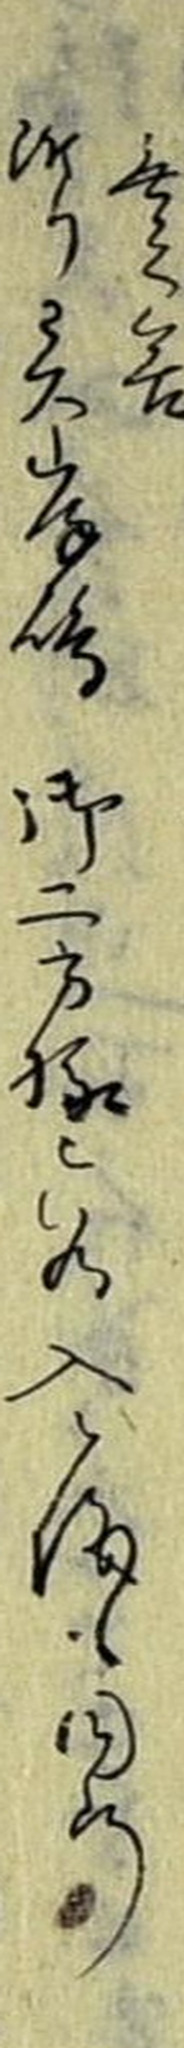附り霊岸嶋御二方様被為入候儀も同断
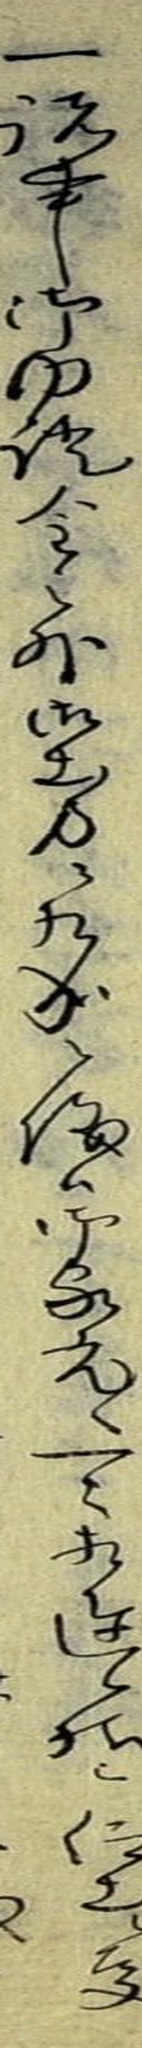一諸事御内証金之外御出方に相成候儀は御家老へ可被相達候様被仰出候事
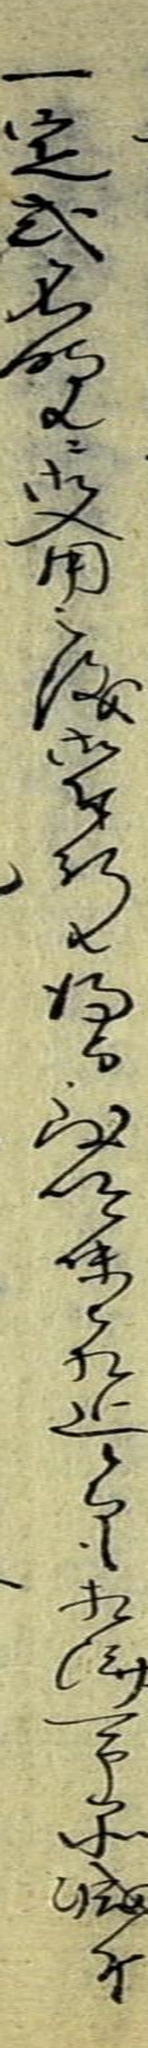一定式不時共に御入用之儀御奉行共得与致吟味被相止候而も相済可申品減付
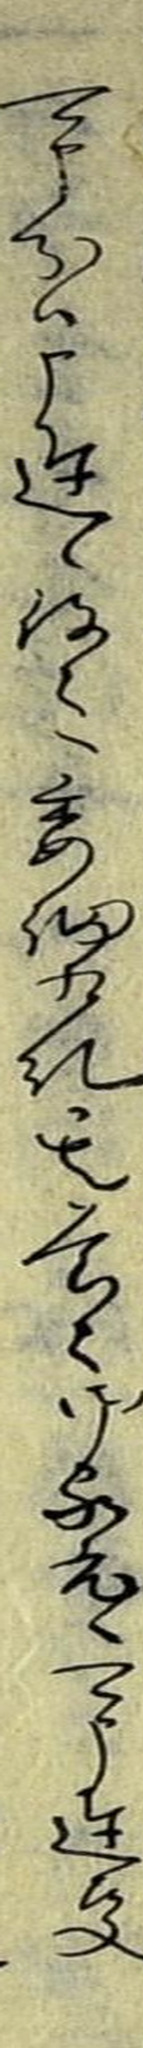可申分は申達候役々へ委細相糺其節々御家老へ可申達事
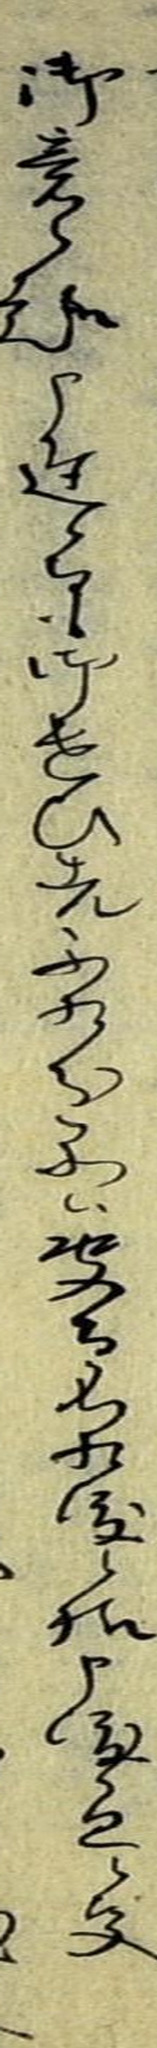御意之趣申達候而も御遣ひ先不相分品は決而不相渡候様申渡置候事
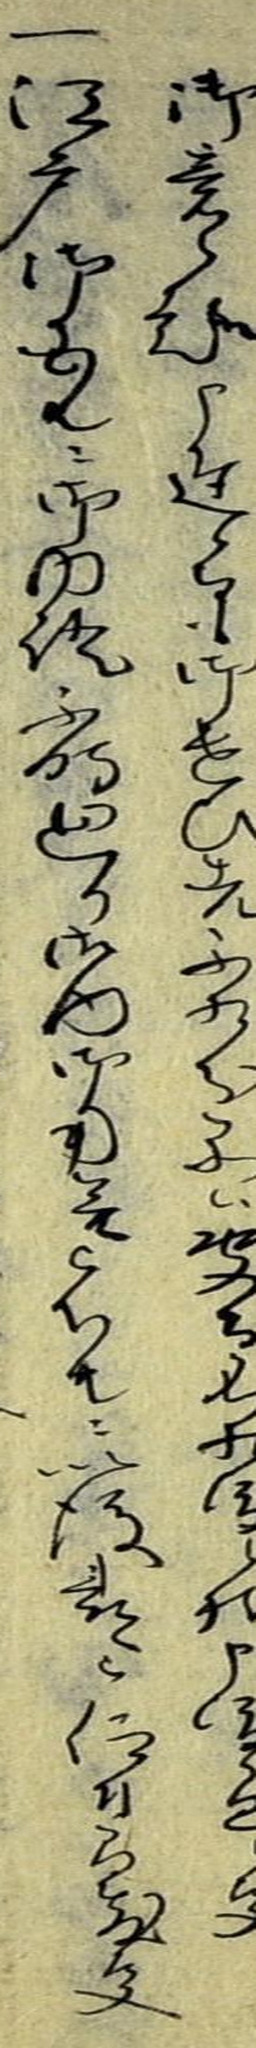一江戸御国共に御内証不時廻り御内御用并被下共に以後表へ被仰付間敷事
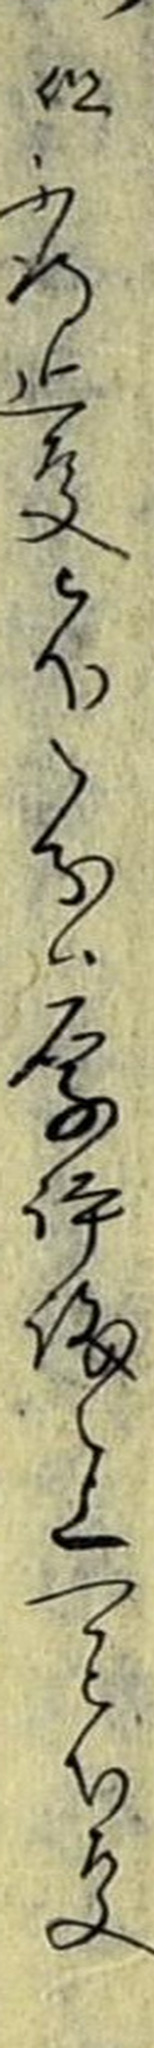但不得止事被下之分は厚評議之上可被下事
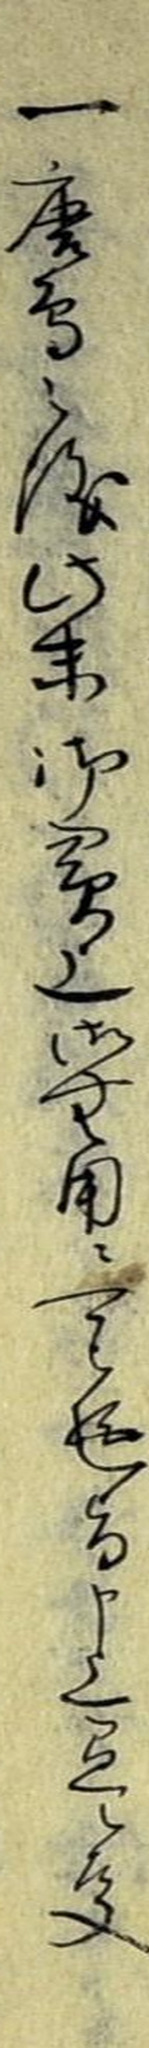一唐鳥之儀此末御買上御無用に可被遊旨申上置候事
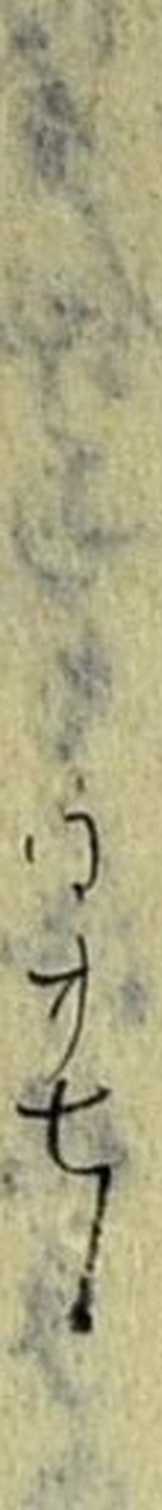同廿七日
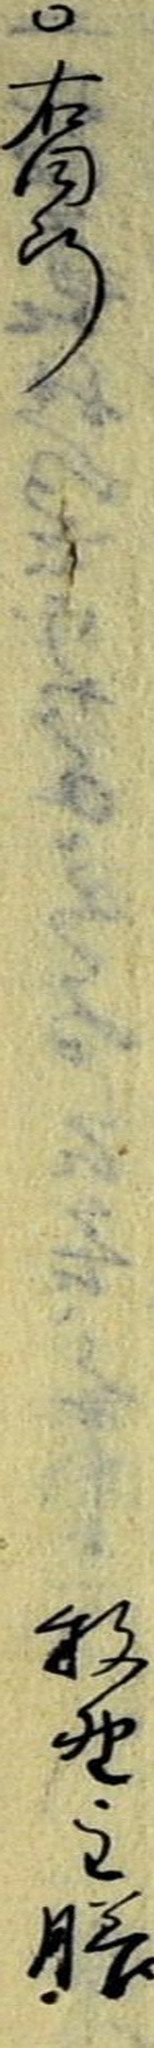〇右同断牧野主膳

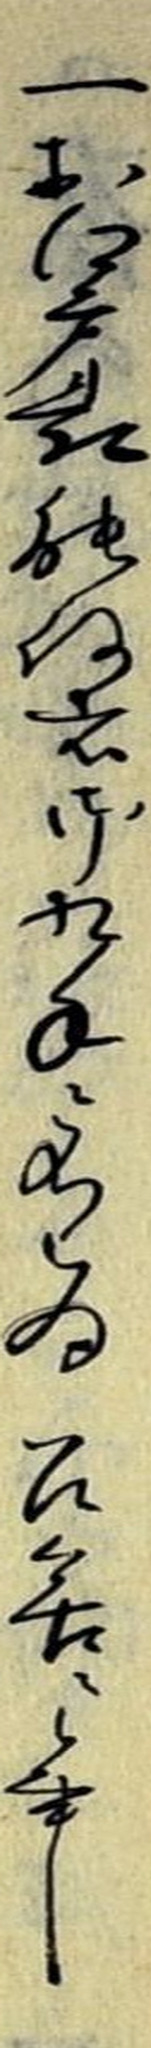一於江戸表能役者御相手に不被為召筈に候事
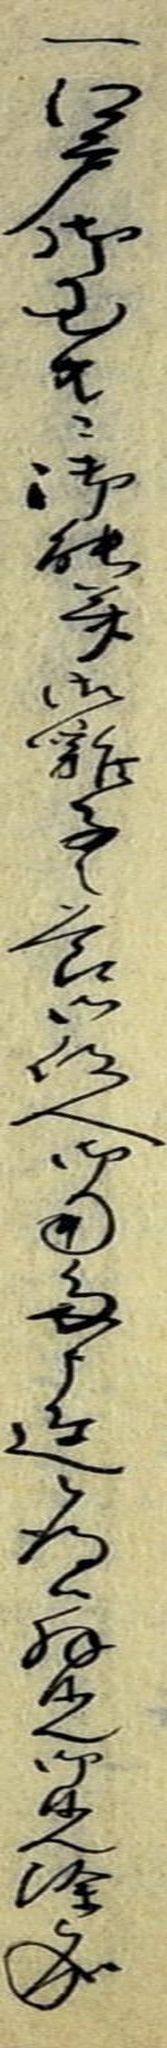一江戸御国共に御能并御囃子之節御役人御用多申達候得は拝見御見除被成
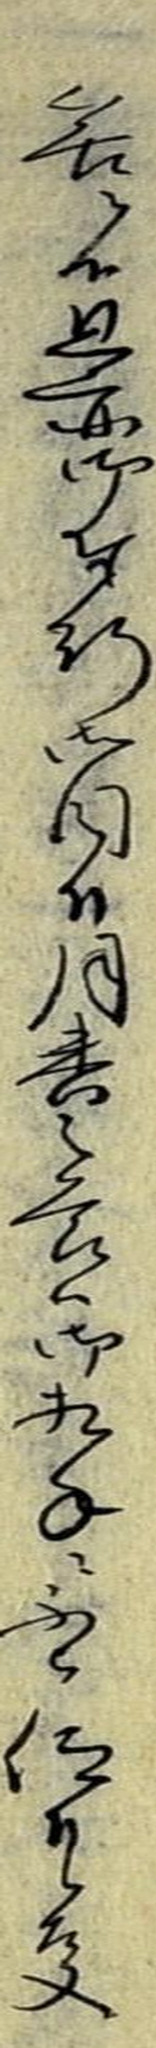筈に候且亦御奉行御目付月番之節は御相手に不被仰付候事
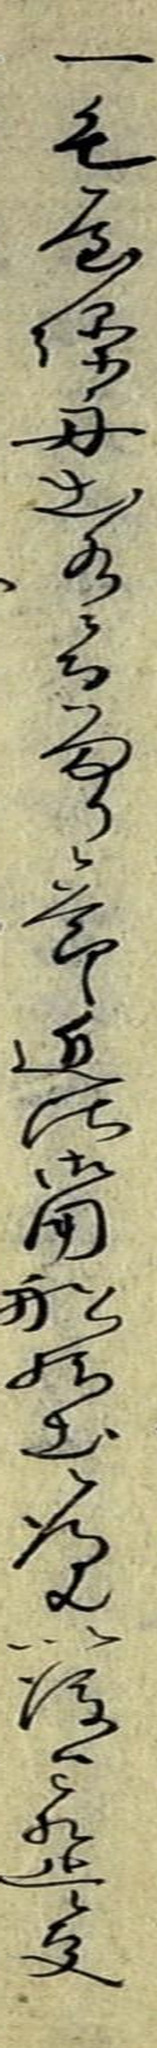一毛屋繰舟出水に而留り候節近頃御用船指出候得共以後は被相止候事
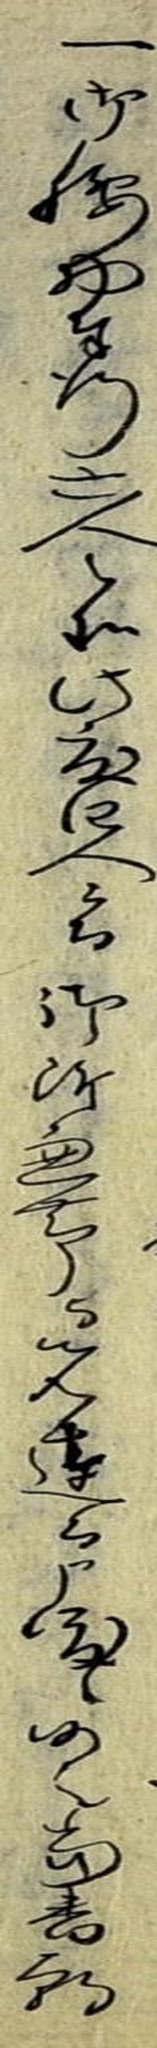一御腰物奉行六人之処此度四人に而御附兼帯与先達而申渡候仍之当番朝
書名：命令之部 二
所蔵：福井県文書館 Fukui Prefectural Archives
